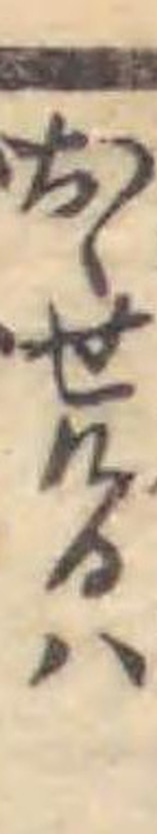おゝせけるは
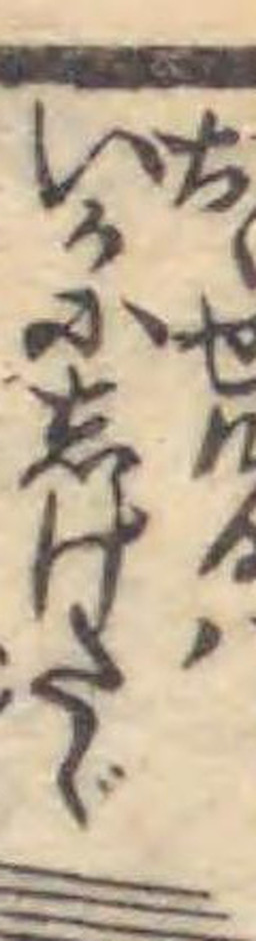いかにしけたゞ
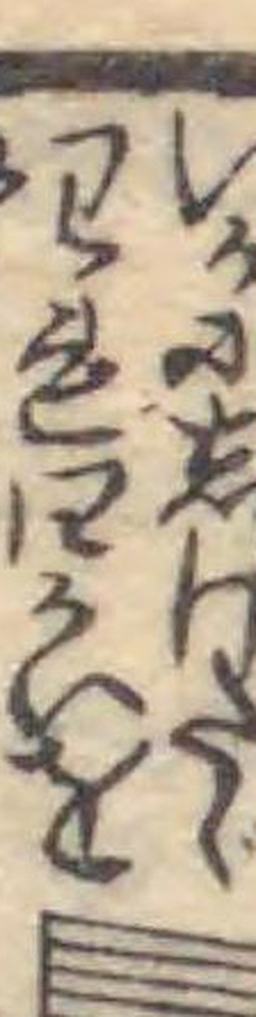われ四かいを
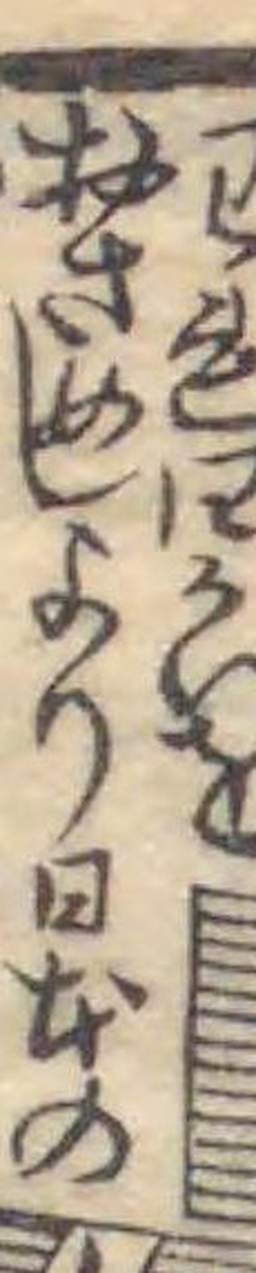おさめしより日本の
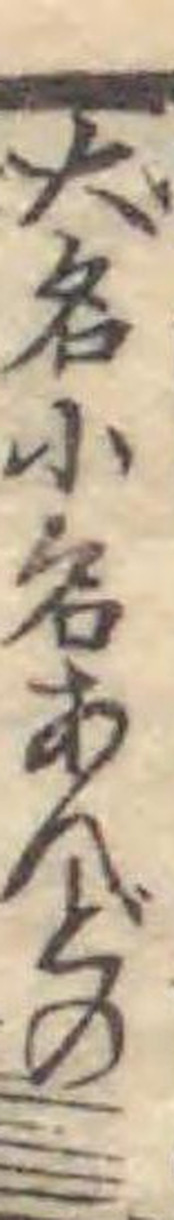大名小名あんどの
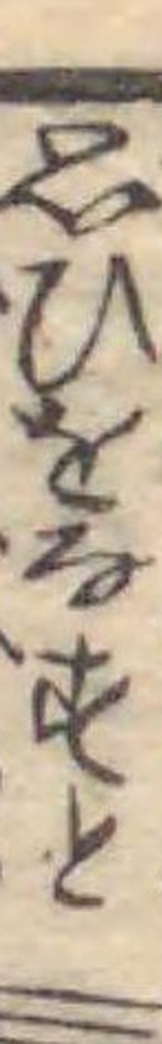思ひをなすと
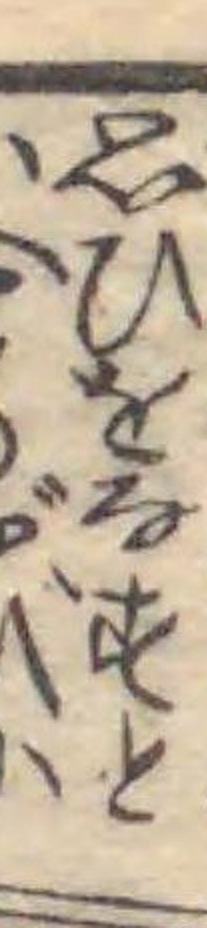思ひをなすと
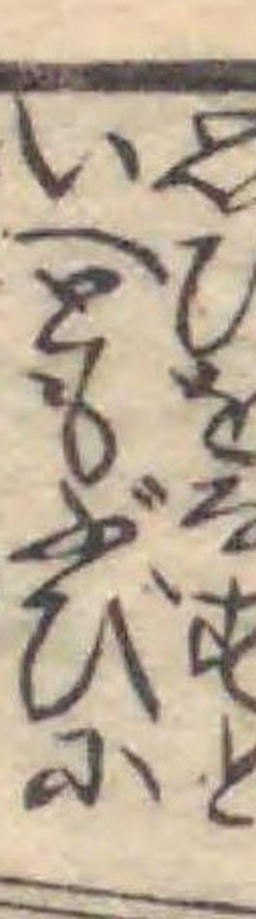いへともぶびに
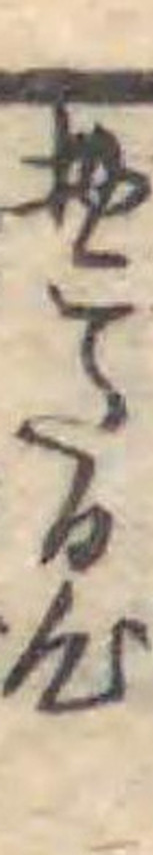おこたる心
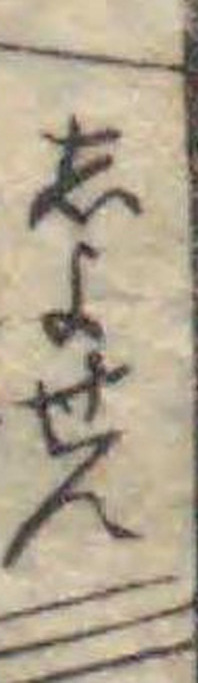しよせん
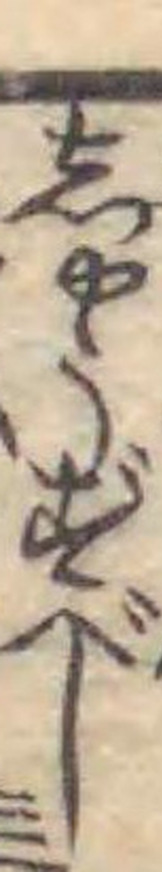しやうずべし
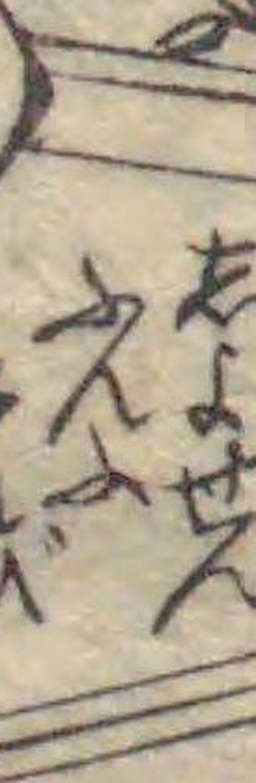ふんふ
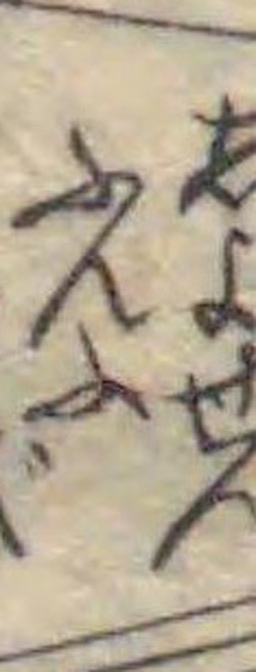ふんふ
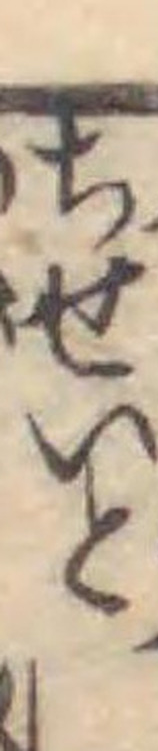ちせいと
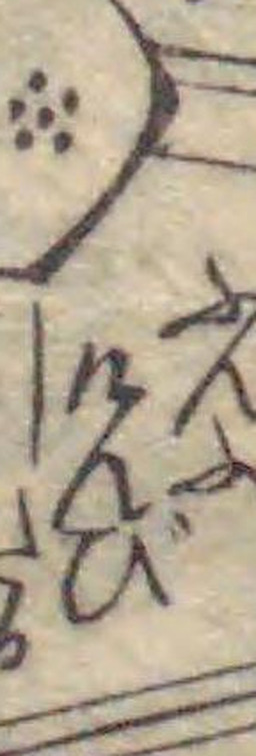けんび
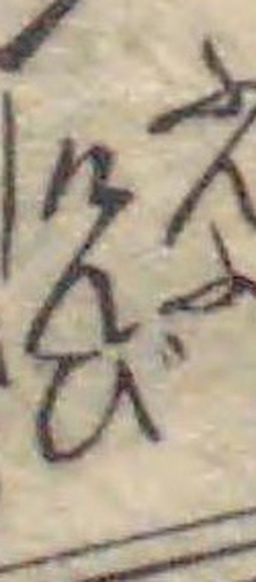けんび
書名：文武二道万石通 : 3巻
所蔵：国立国会図書館 National Diet Library, JAPAN
